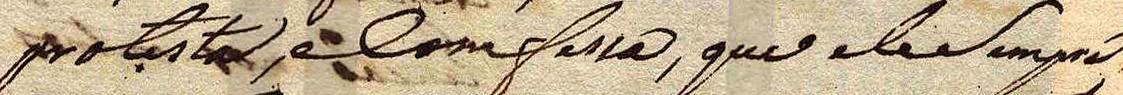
protestar, e Comfessar, que ele Sempre
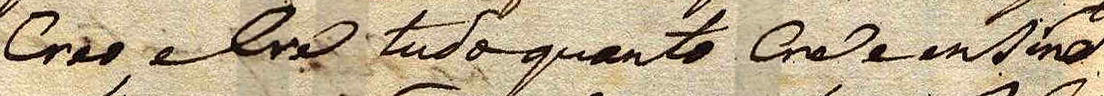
Creo, e Cre tudo quanto Cre, e ensina
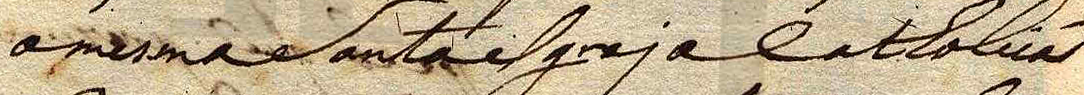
a mesma Santa Igreja Catholica
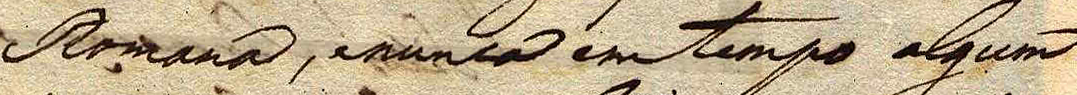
Romana, e nunca em tempo algum
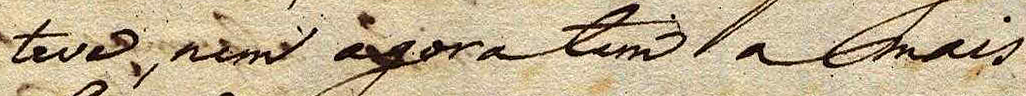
teve, nem agora tem a mais
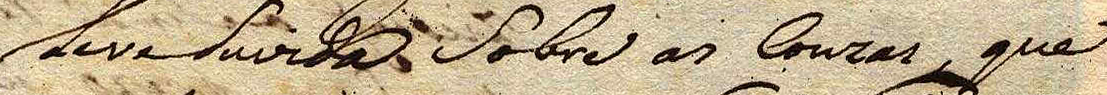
Leve duvida Sobre as Couzas, que
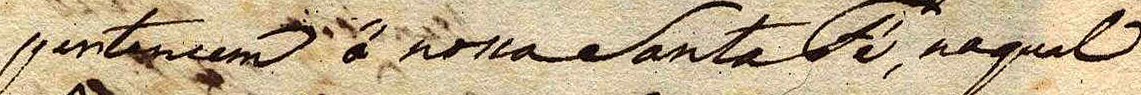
pertencem á nossa Santa Fé, na qual
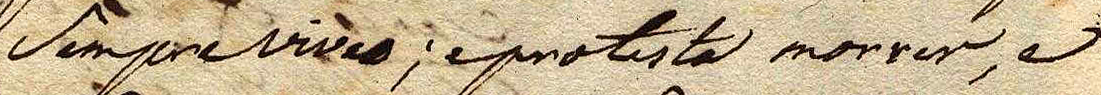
Sempre viveo; e protesta morrer, e
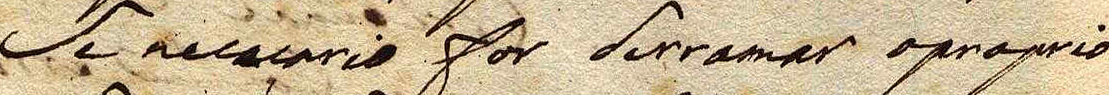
Se neceçario for derramar o proprio
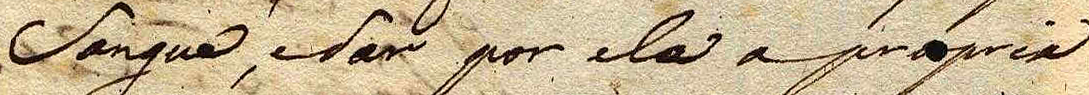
Sangue, e dar por ela a propria
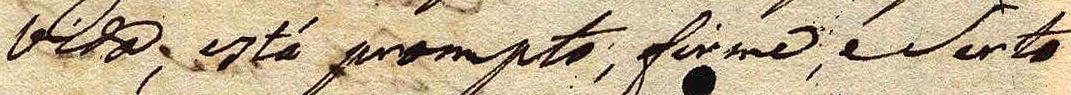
vida, está prompto, firme, e Serto
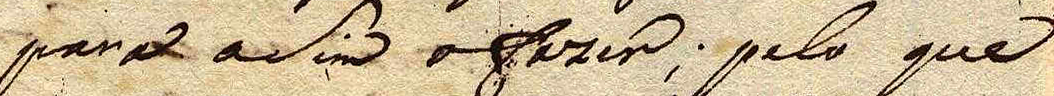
para aSim o fazer; pelo que
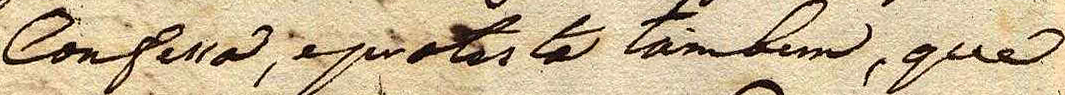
Confessa, e protesta tambem, que
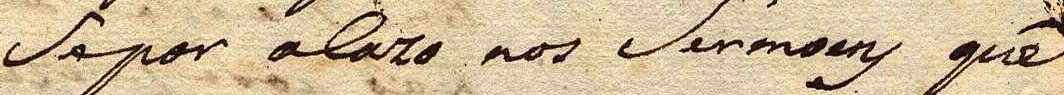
Se por aCazo nos Sermoens que
